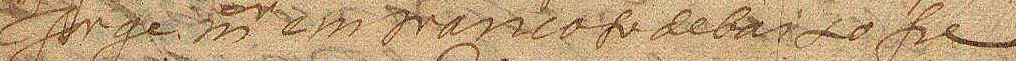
Jorge mor em trancoso de baixo fre
